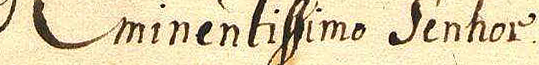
Eminentissimo Senhor
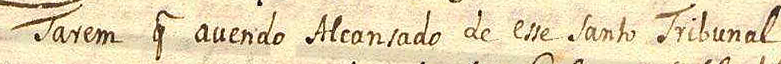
tarem q̄ auendo Alcansado de esse santo Tribunal
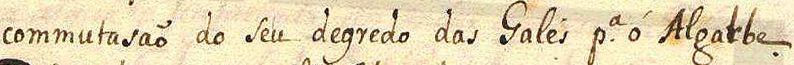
commutasaõ do seu degredo das Galés p.a ó Algalbe
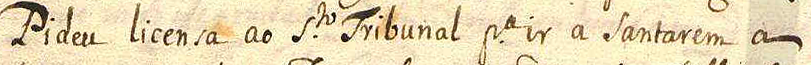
Pideu licensa ao s.to Tribunal p.a ir a Santarem a
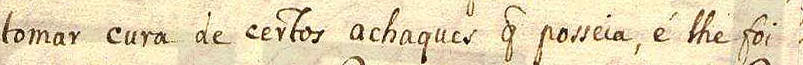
tomar cura de certos achaques q̄ posseia, é lhe foi
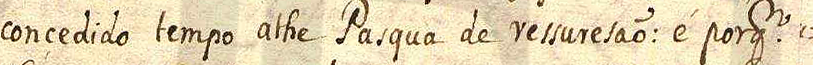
conçedido tempo athe Pasqua de ressuresaõ: é porq̄to.
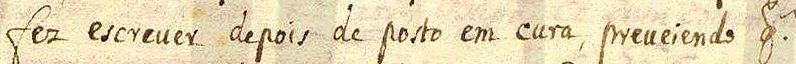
fez escreuer depois de posto em cura, preueiendo q̄.
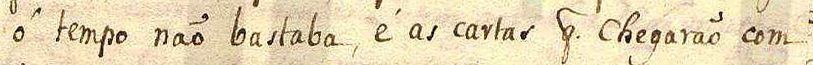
ó tempo naõ bastaba, é as cartas q̄. chegaraõ com
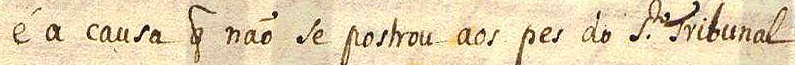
é a causa q̄ naõ se postrou aos pes do s.to Tribunal
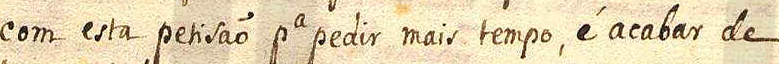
com esta petisaõ pa pedir mais tempo, é acabar de
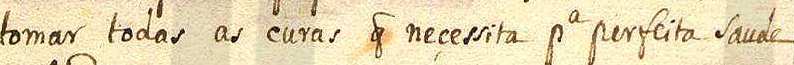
tomar todas as curas q̄ neçessita pa perfeita saude
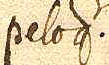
pelo q̄.
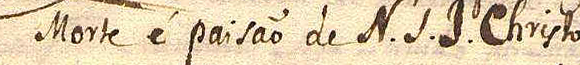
Morte é paisaõ de N. S. I. Christo
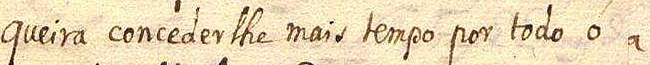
queira concederlhe mais tempo por todo o
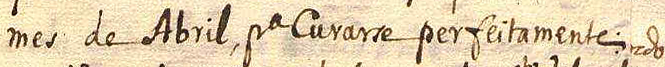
mes de Abril, pa Curarse perfeitamente:
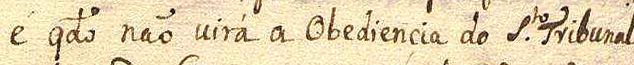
é qd̄o naõ uirá a Obediençia do S.to Tribunal
